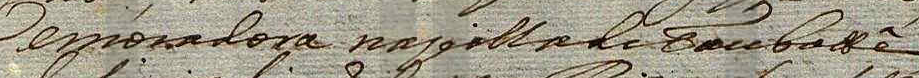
e moradora na Villa de Taubattê
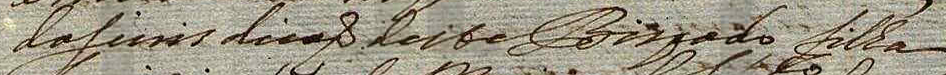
da jurisdiçaõ deste Bispado filha
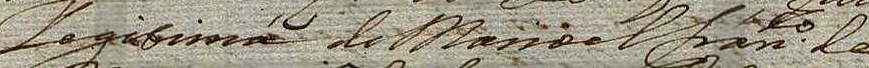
Legitima de Manoel fran.co de
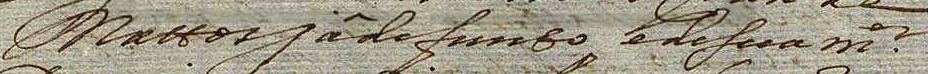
Mattos jâ defunto e de sua m.er
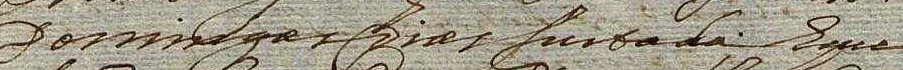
Domingas Dias furtada. E que
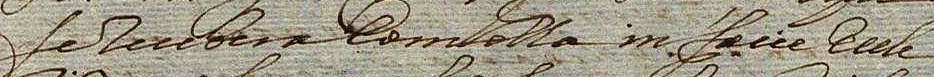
se Recebera com ella in facie Eccle
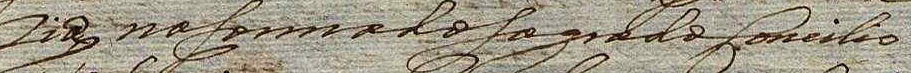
Ziæ na forma do sagrado Concilio
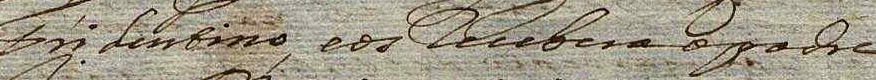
Tridentino, e os Recebera o padre
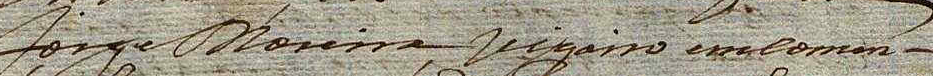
Jorge Moreira, Vigairo emcomen
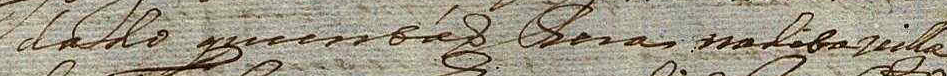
dado que entaõ hera na dita villa
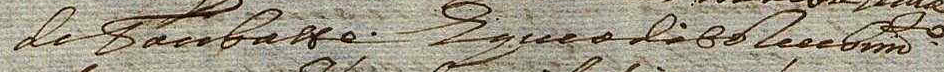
de Taubatte; E que o dito Recebim.to
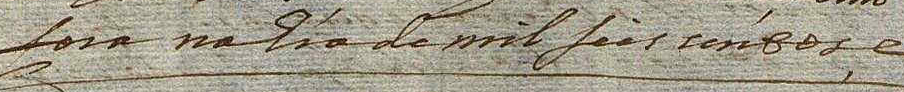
fora na Era de mil seiscentos e
